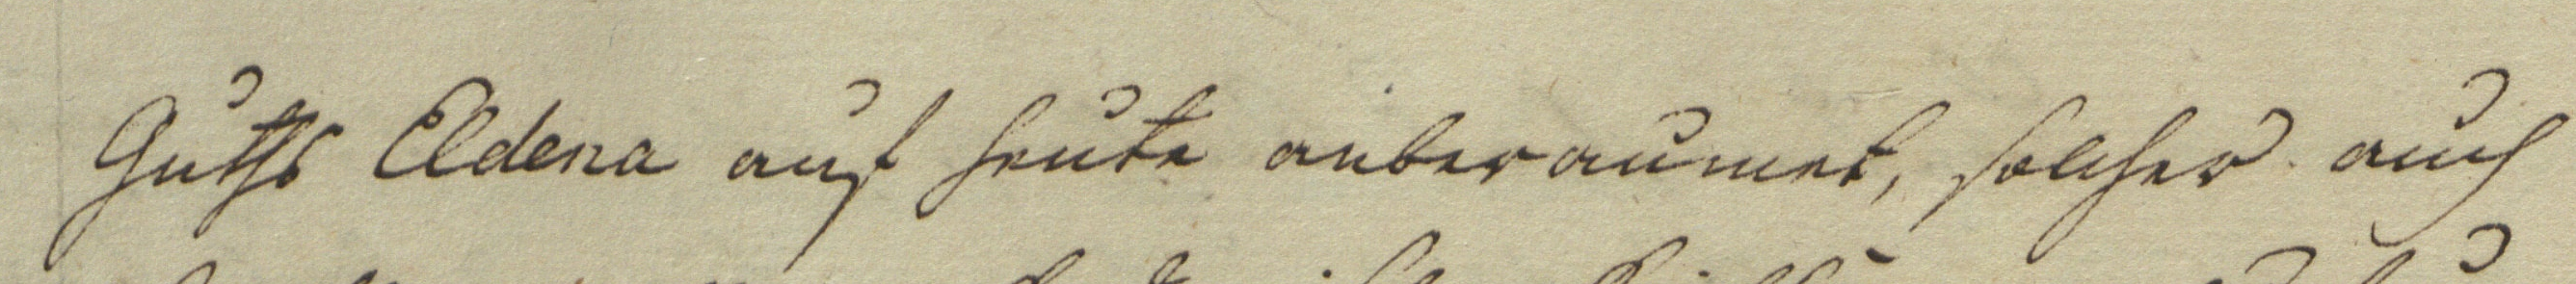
Guths Eldena auf heute anberaumet, solcher auch
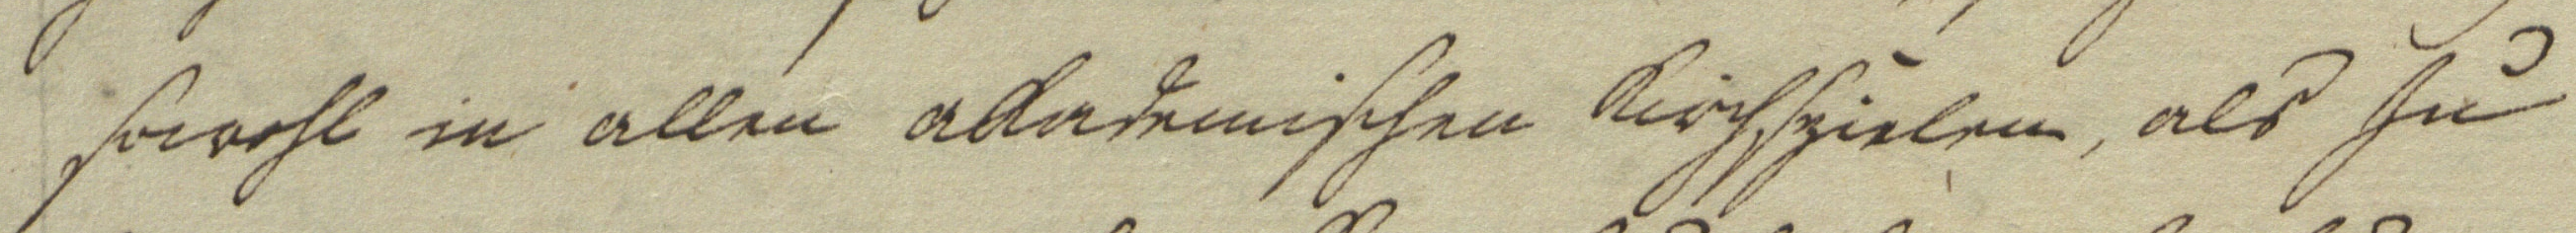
sowohl in allen akademischen Kirchspielen, als zu
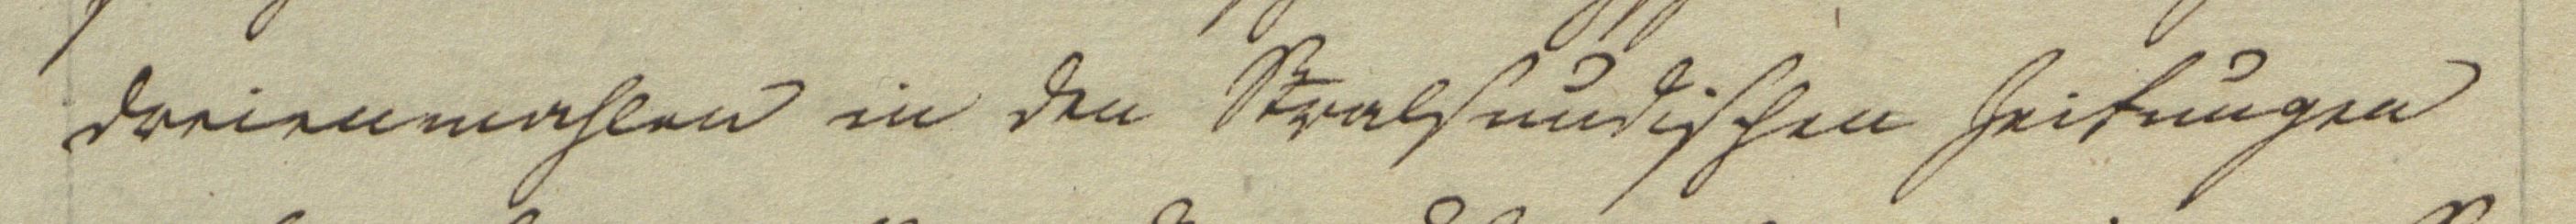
dreienmahlen in den Stralsundischen Zeitungen
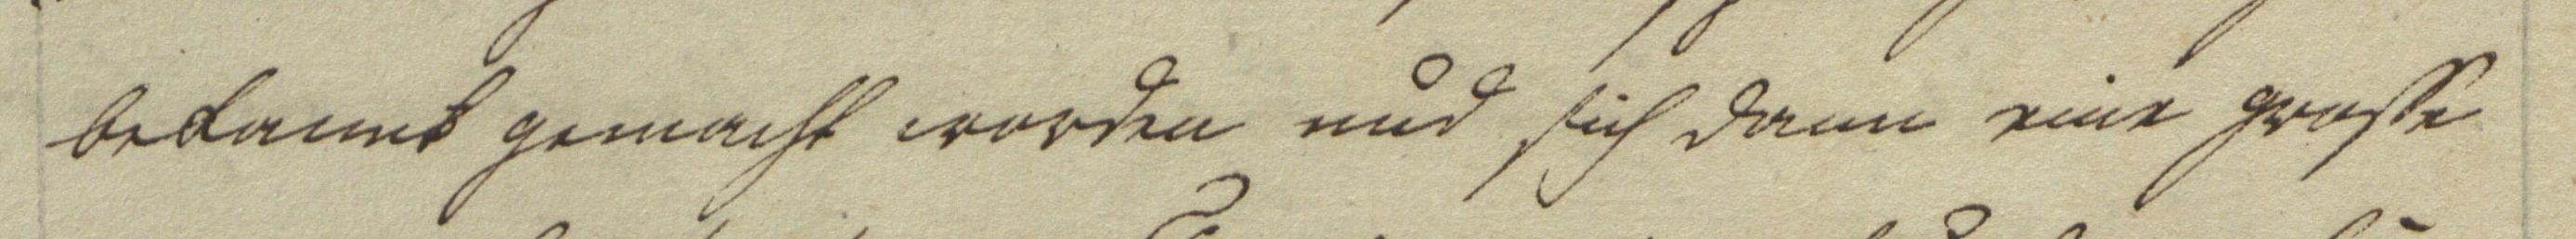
bekannt gemacht worden und sich dann eine grosse
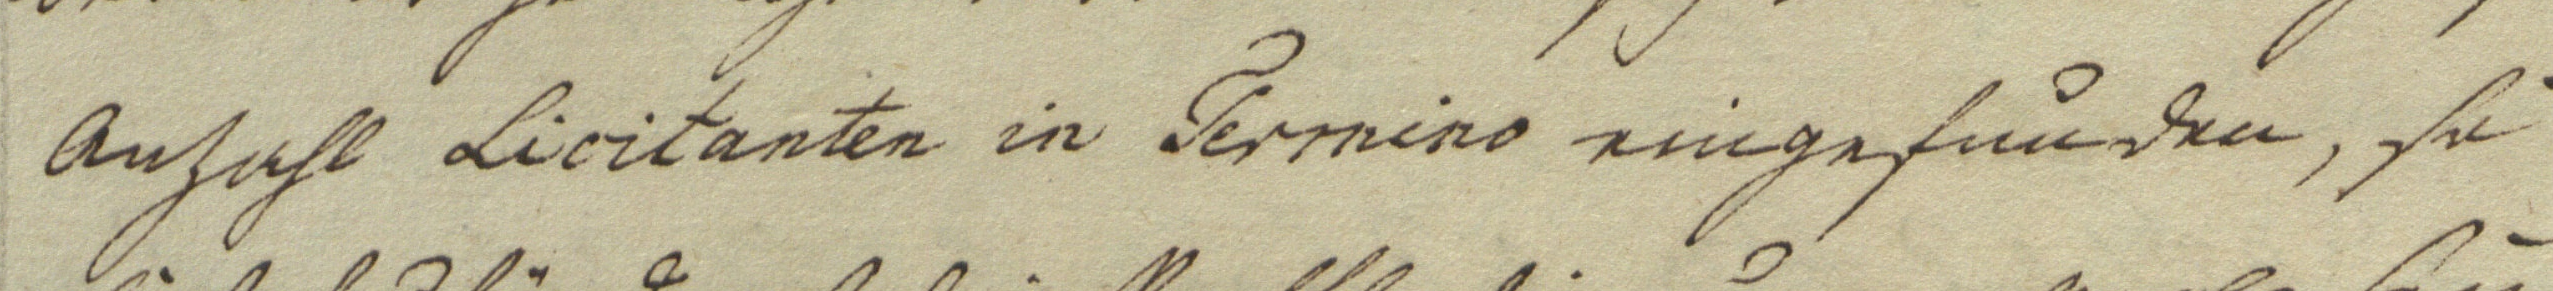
Anzahl Licitanten in Termino eingefunden, so
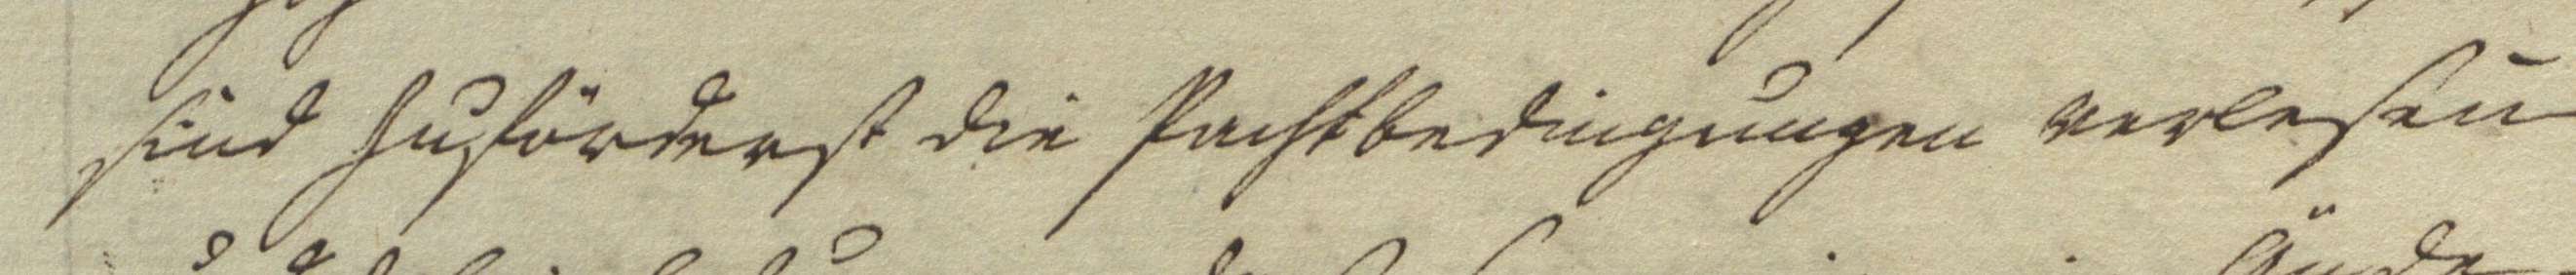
sind zuförderst die Pachtbedingungen verlesen
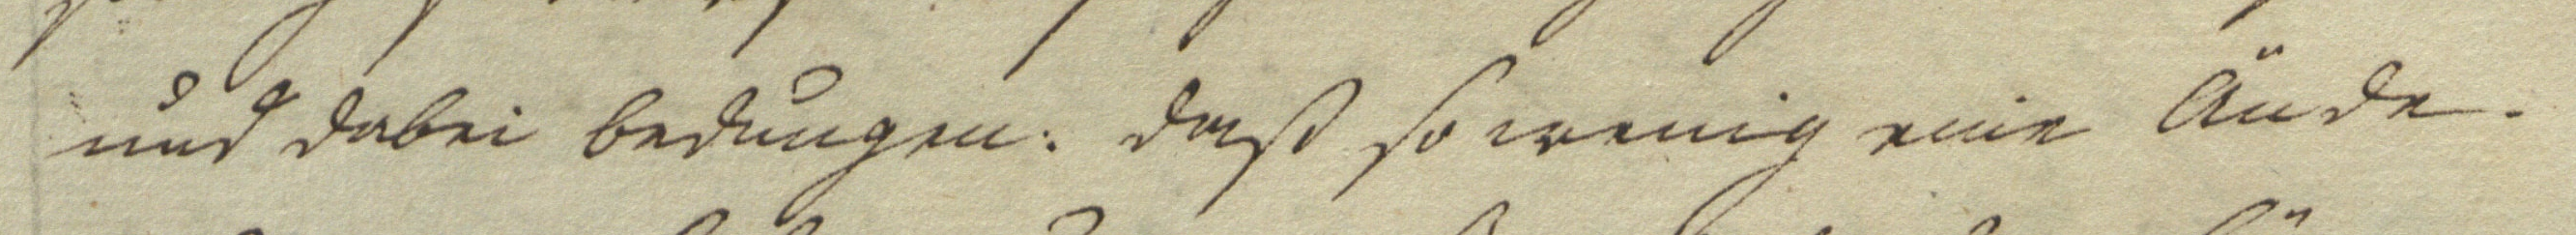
und dabei bedungen: daß so wenig eine Ände¬
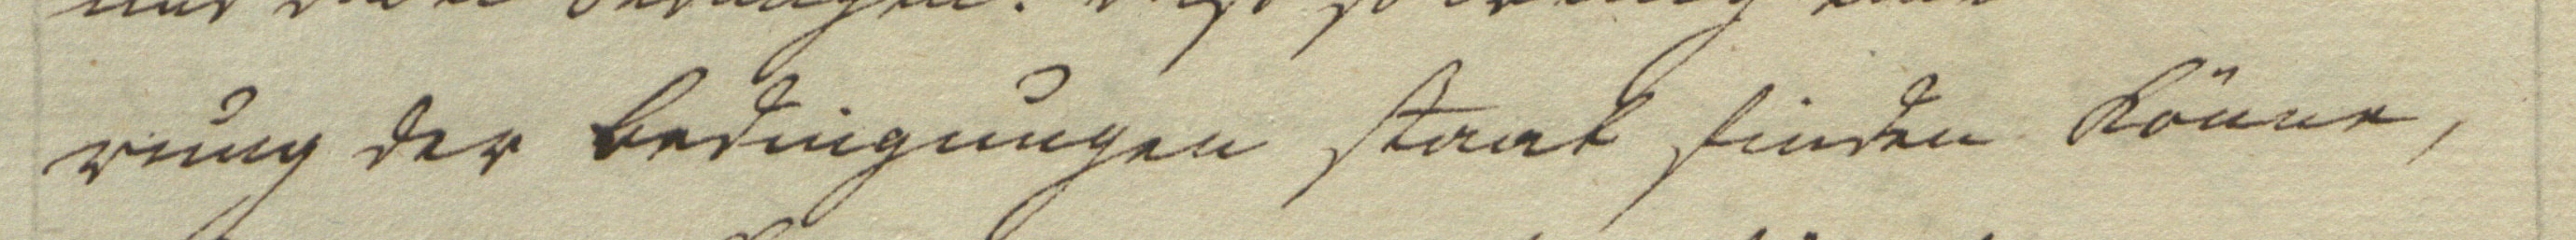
rung der Bedingungen staat finden könne,
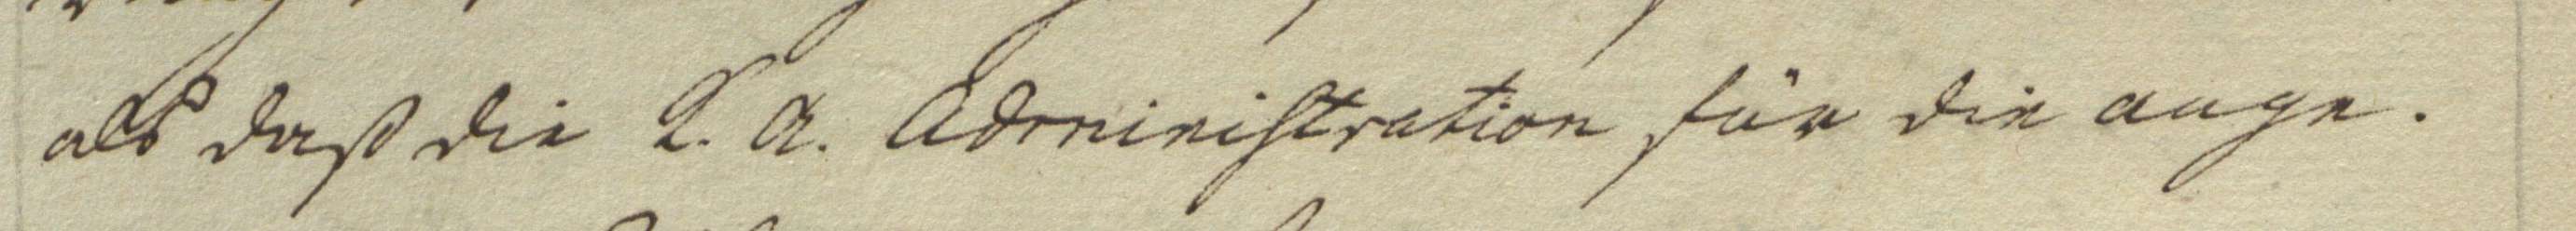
als daß die K. A. Administration für die ange¬
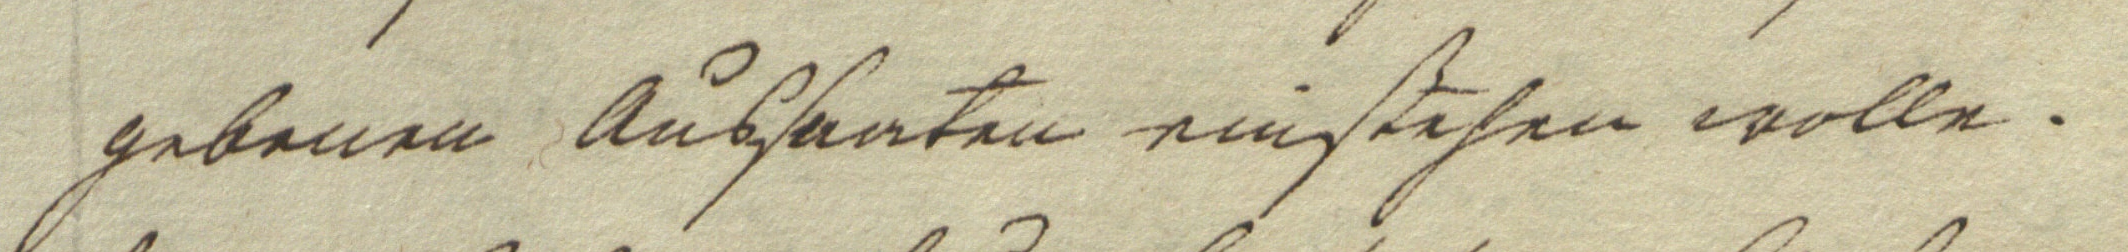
gebenen Aussaaten einstehen wolle.
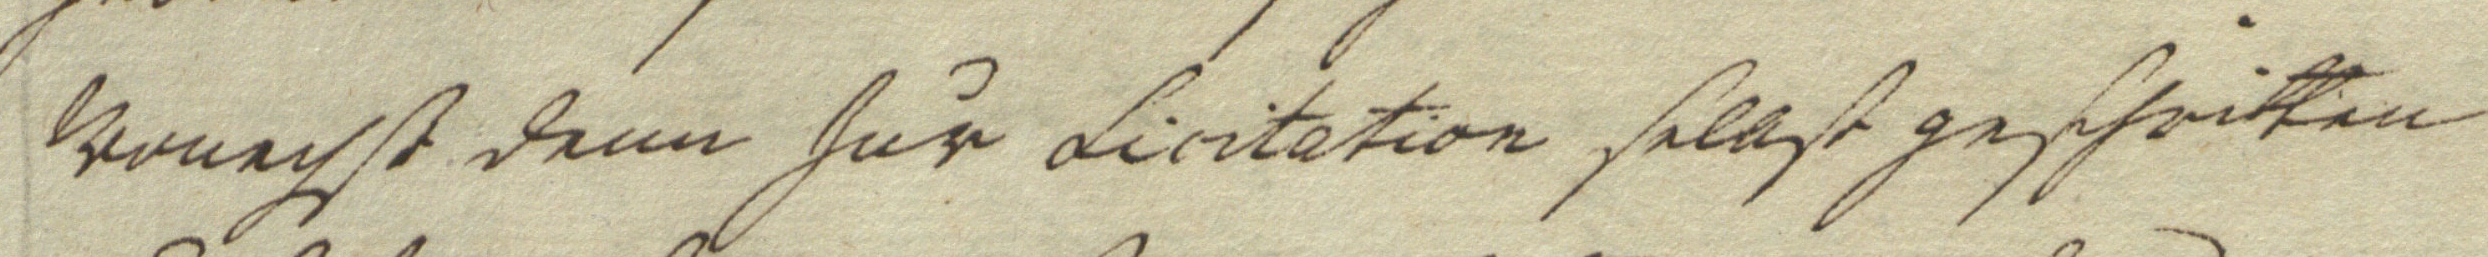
Wonechst denn zur Licitation selbst geschritten
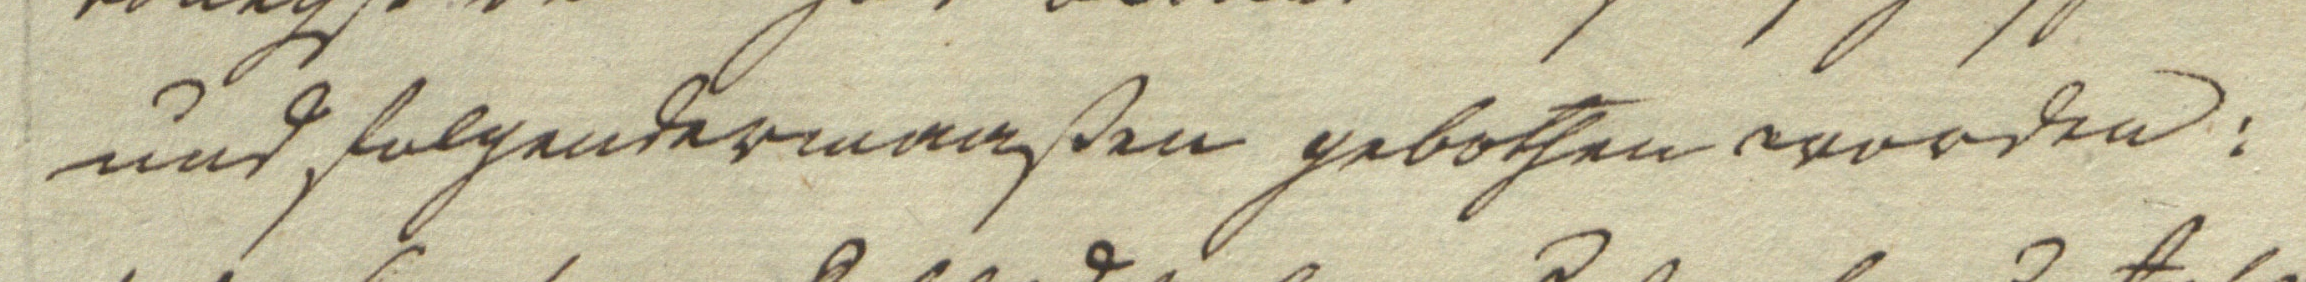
und folgendermaaßen gebothen worden:
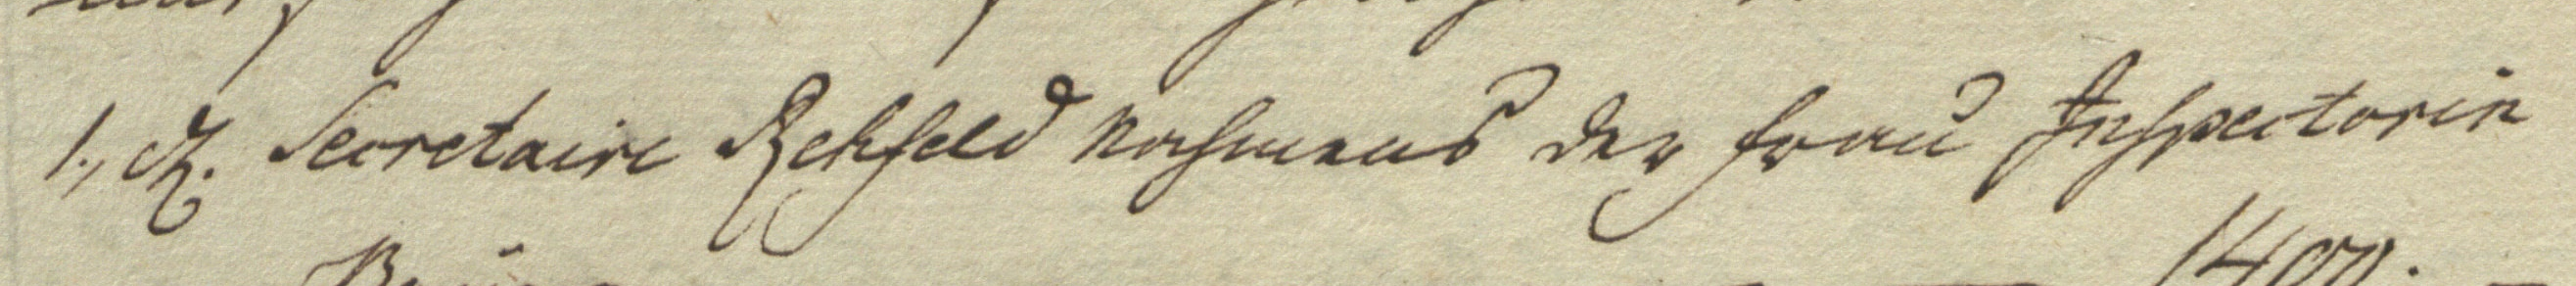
1., dh. Secretaire Rehfeld Nahmens der Frau Inspectorin
